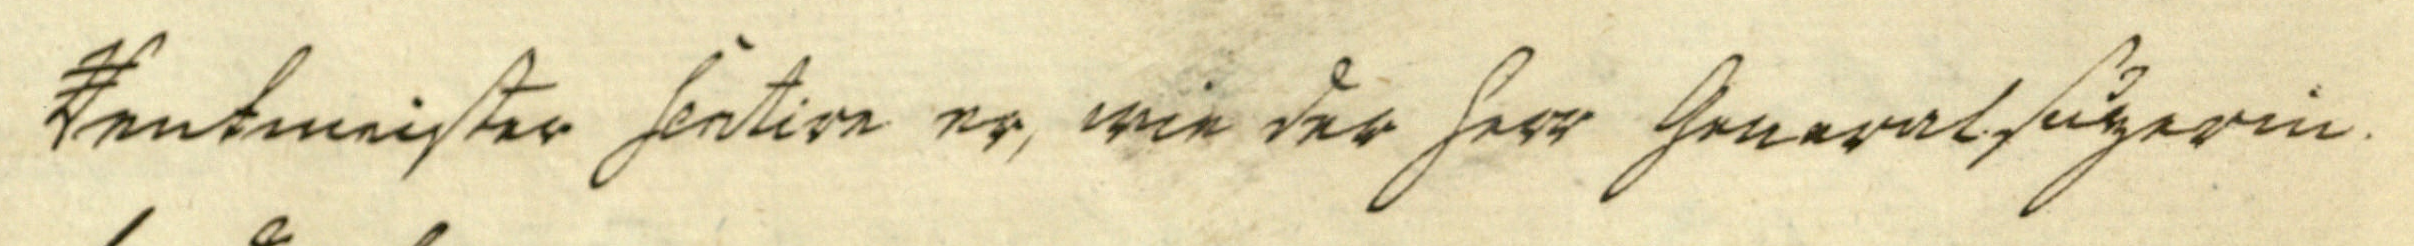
Rentmeister sentire er, wie der Herr Generalsuperin¬
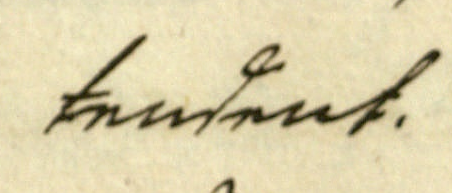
tendent.
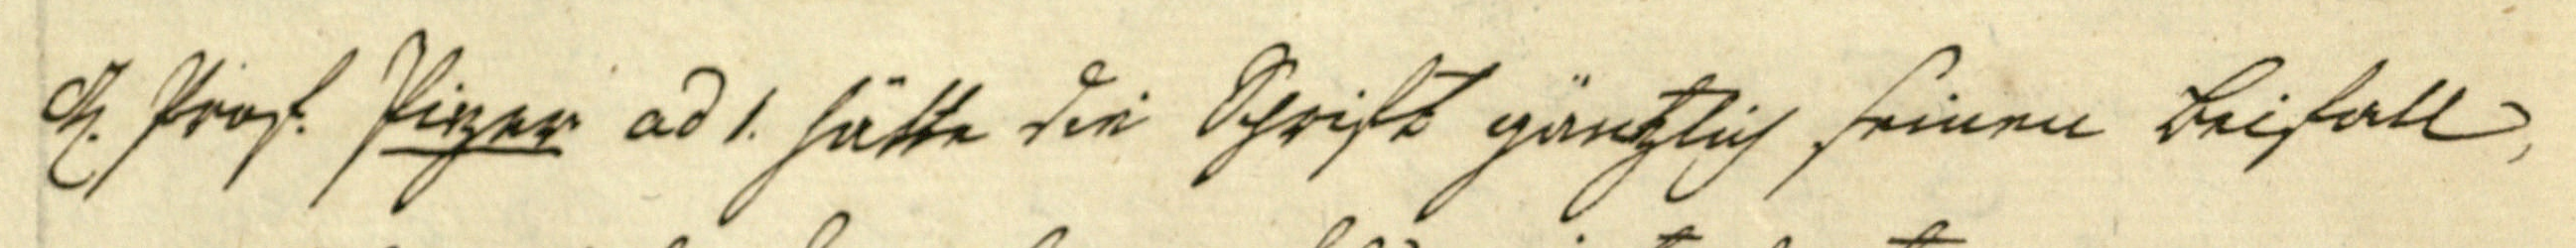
dh. Prof. Piper ad 1. hätte die Schrift gäntzlich seinen Beifall
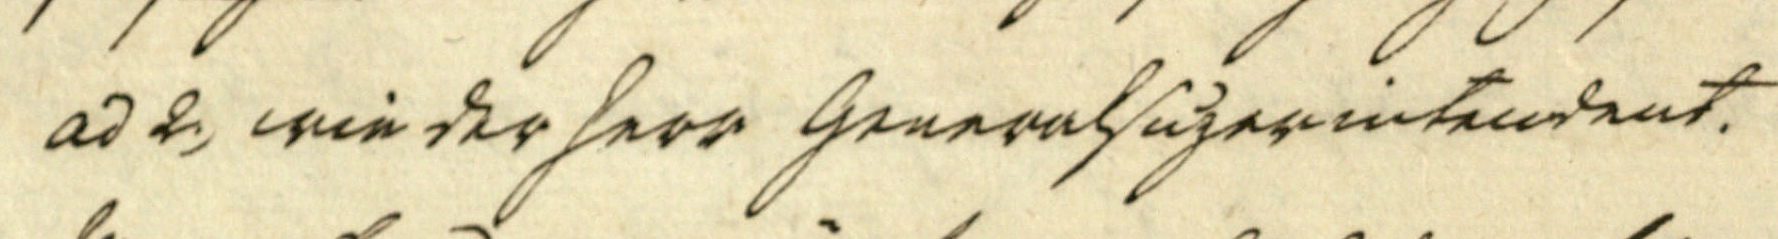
ad 2., wie der Herr Generalsuperintendent.
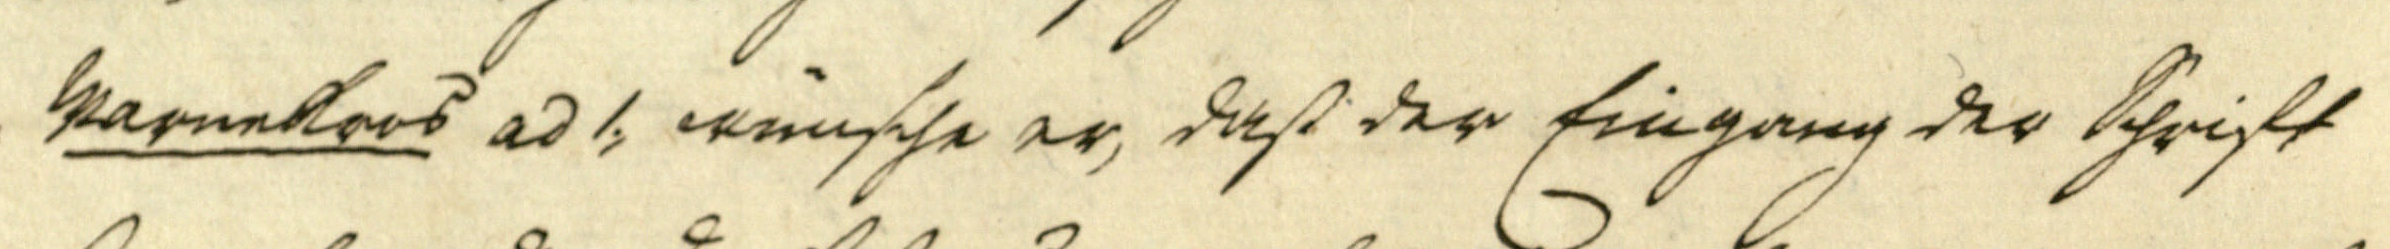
Warnekros ad 1. wünsche er, daß der Eingang der Schrift
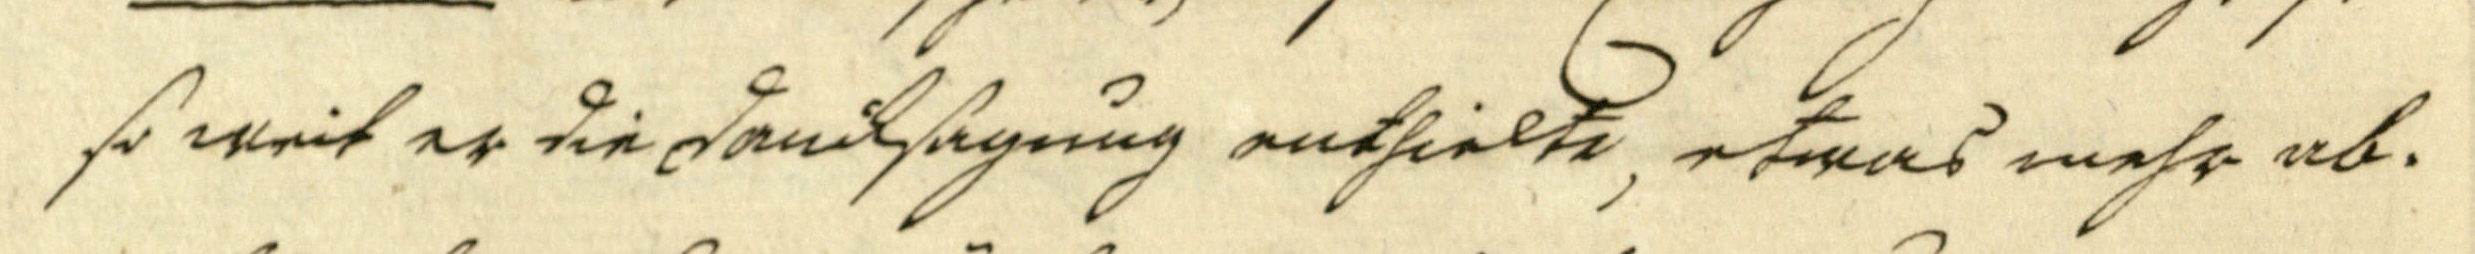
so weit er die Dancksagung enthielte, etwas mehr ab¬
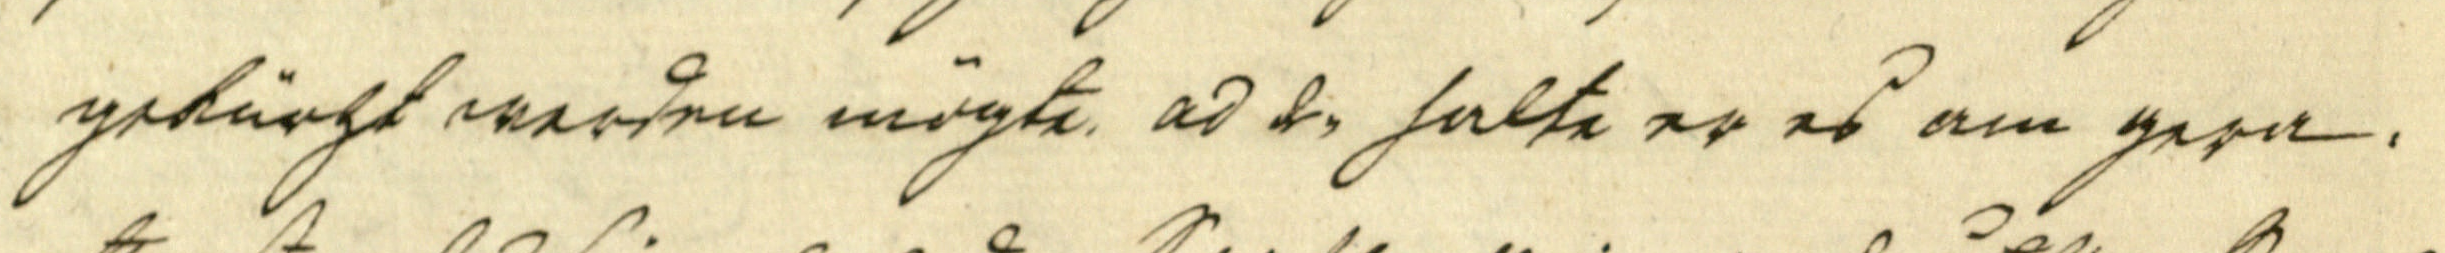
gekürzt werden mögte. ad 2., halte er es am gera¬
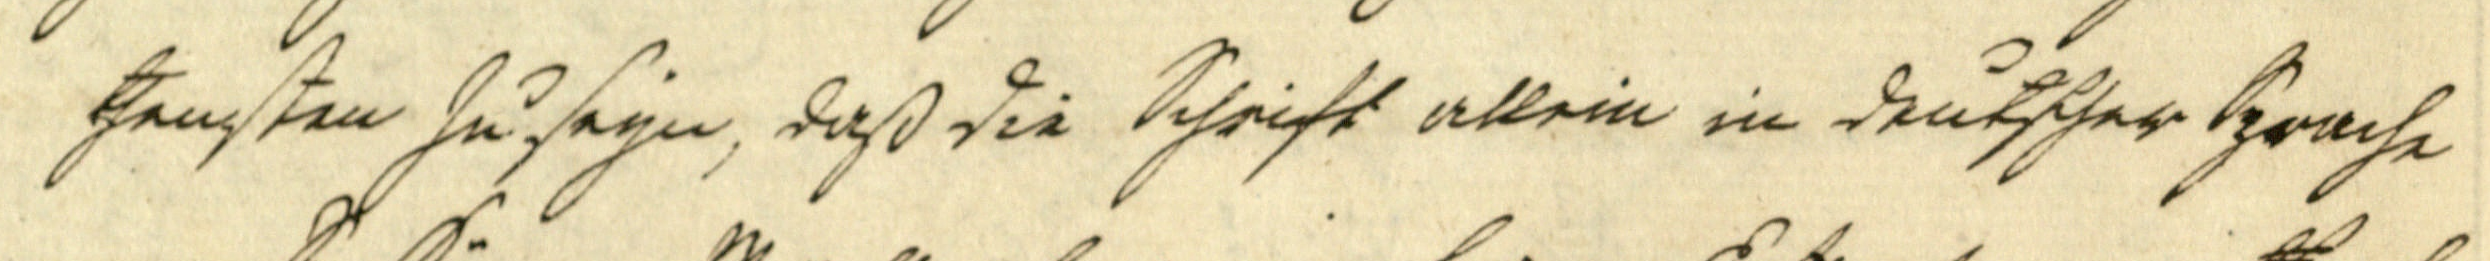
thensten zu seÿn, daß die Schrift allein in deutscher Sprache
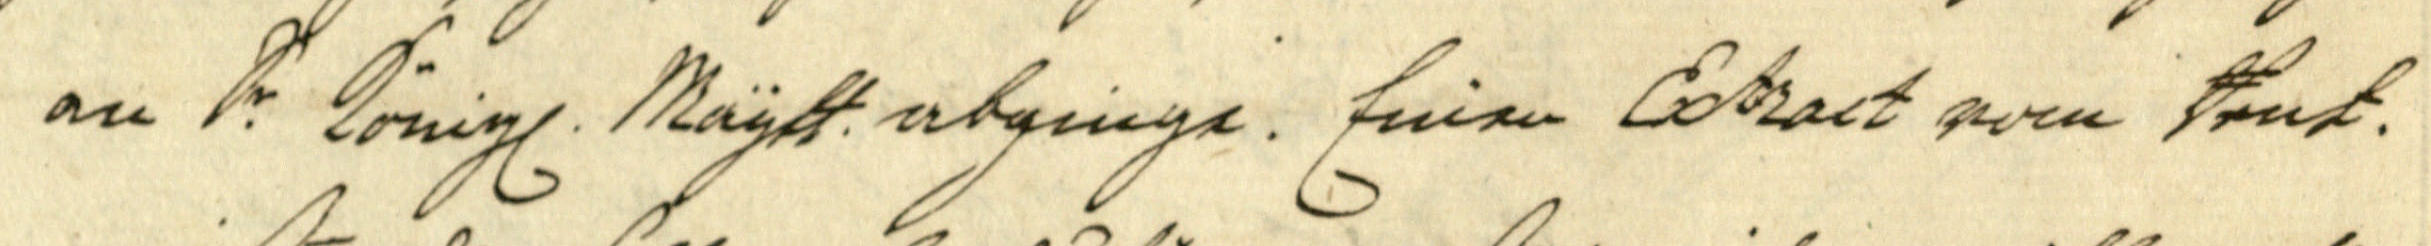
an Sr. Königl. Maÿtt. abginge. Einen Extract vom Rent¬
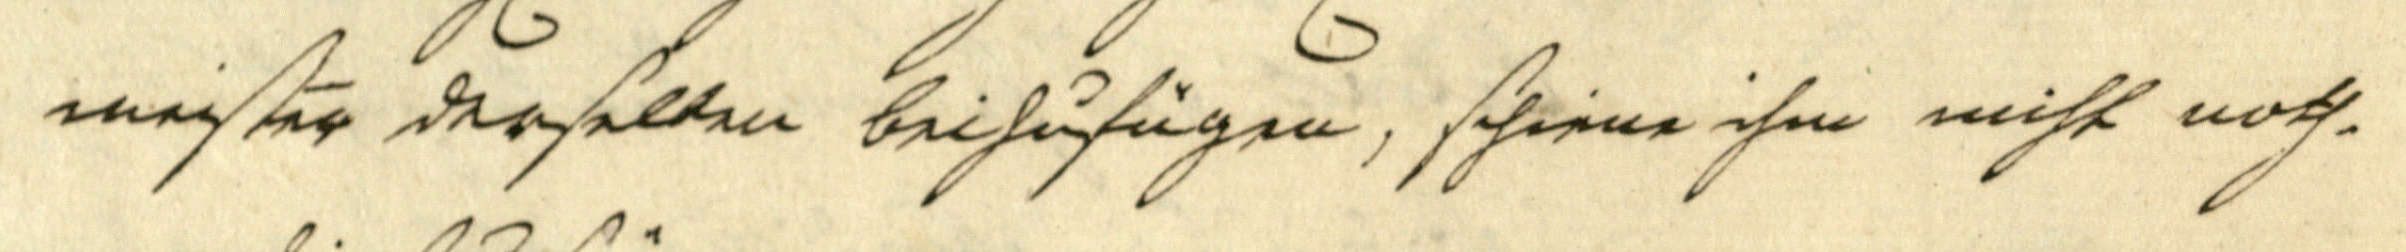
meister derselben beizufügen, schiene ihm nicht noth¬
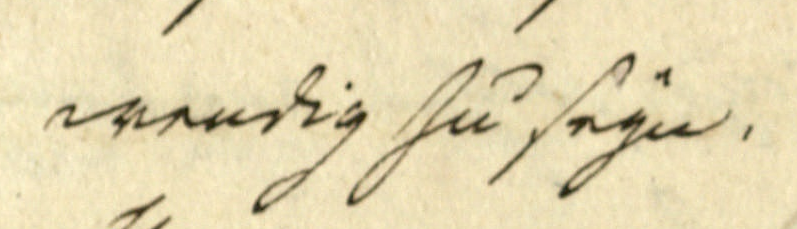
wendig zu seÿn.
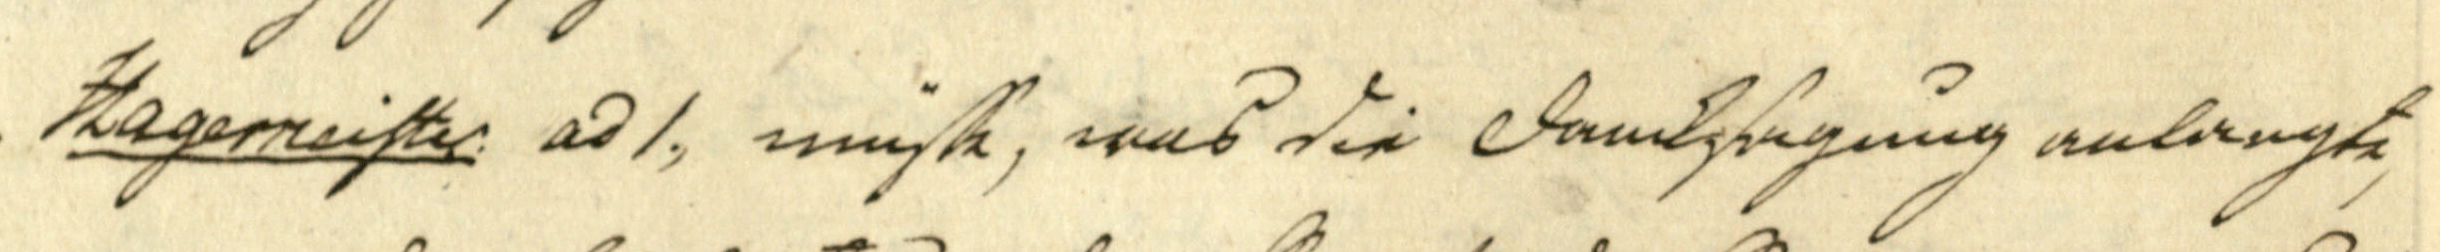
Hagemeister. ad 1., müsse, was die Dancksagung anlangte,
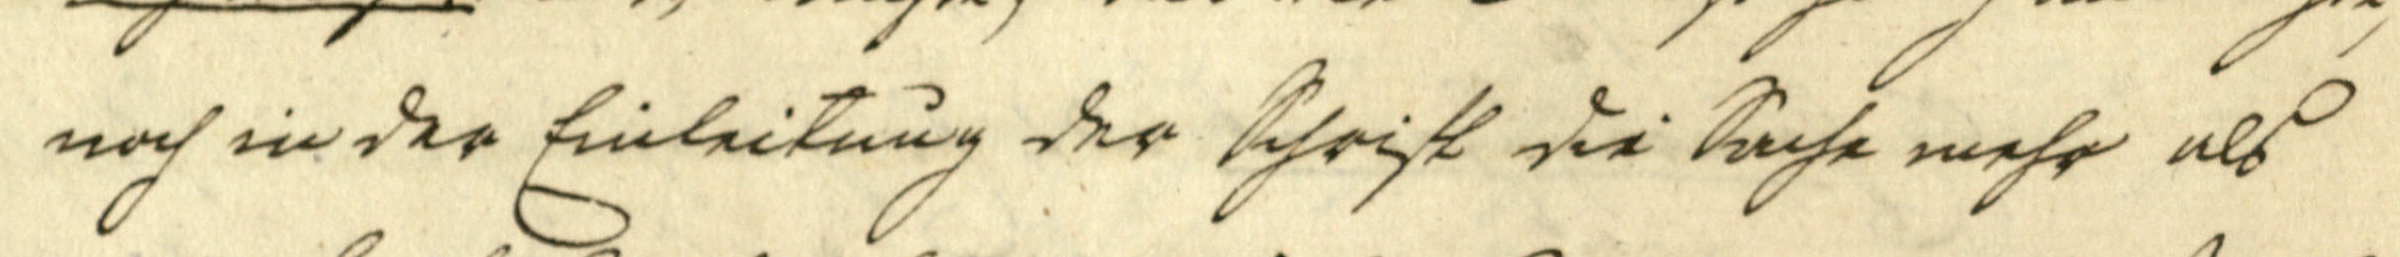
noch in der Einleitung der Schrift die Sache mehr als
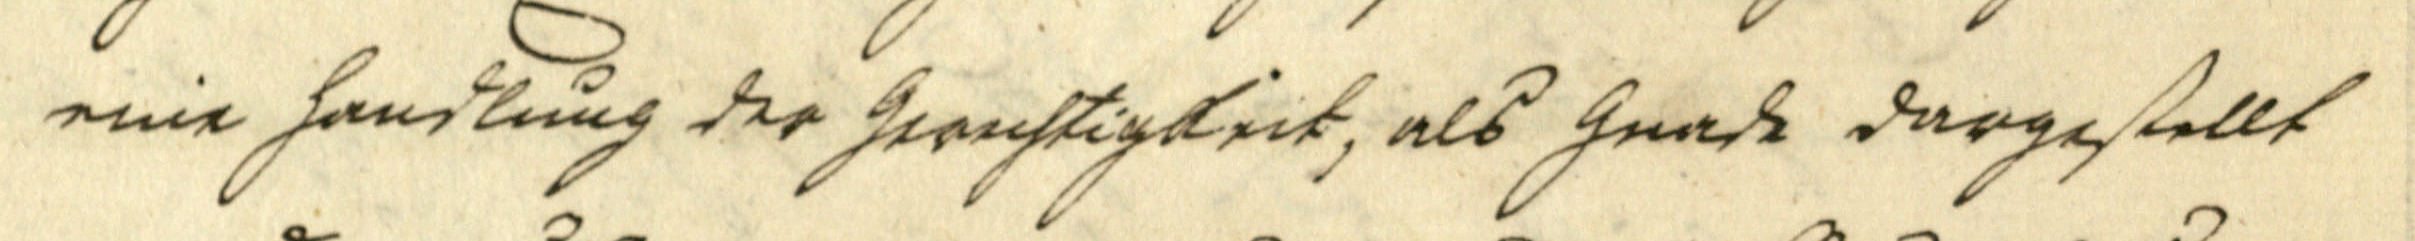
eine Handlung der Gerechtigkeit, als Gnade dargestellt
